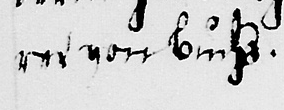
rer von Buchs
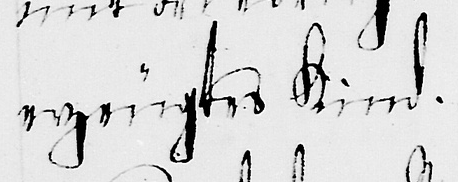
erzeugtes Kind.
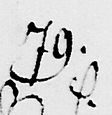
Mau¬
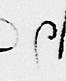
E¬
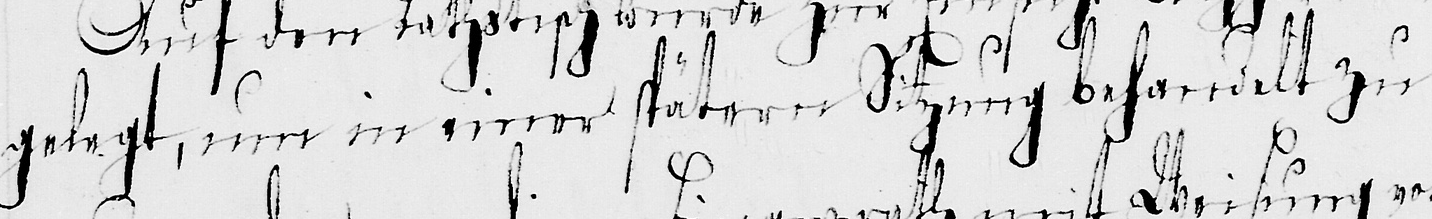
gelegt, um in einer spätern Sitzung behandelt zu
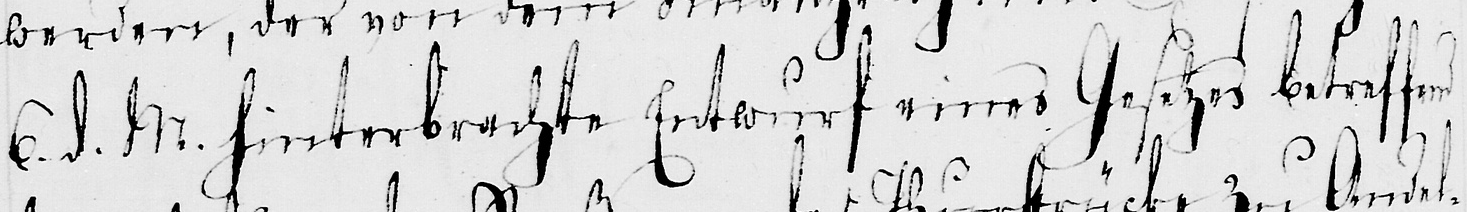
6. d. M. hinterbrachte Entwurf eines Gesetzes betreffe¬
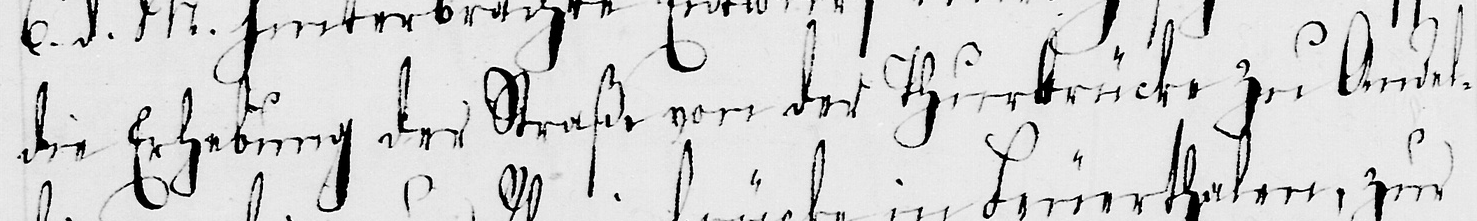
die Erhebung der Straße von der Thurbrücke zu Andel¬
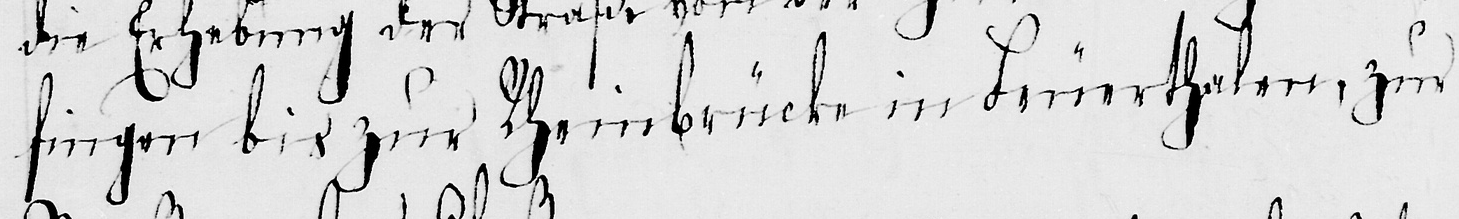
fingen bis zur Rheinbrücke in Feuerthalen, zur
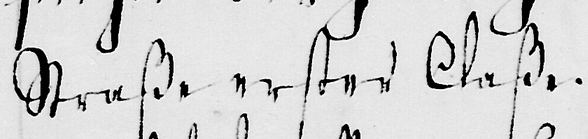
Straße erster Claße.
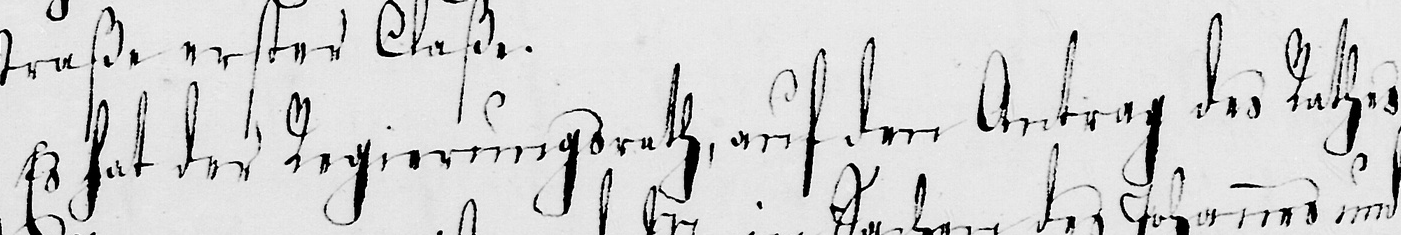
s hat der Regierungsrath, auf den Antrag des Rathes
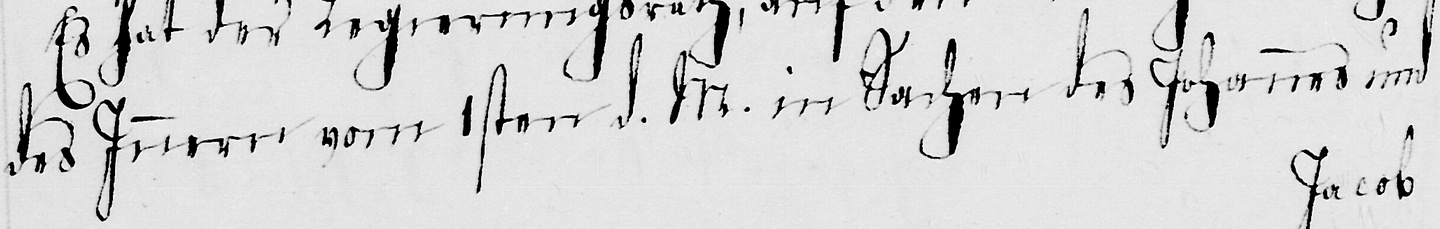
des Innern vom 1sten d. M. in Sachen des Johannes und
